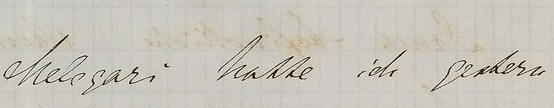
Melegari hatte ich gestern
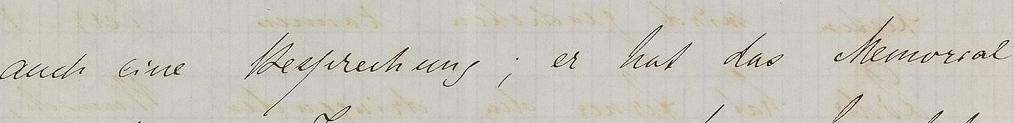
auch eine Besprechung; er hat das Memorial
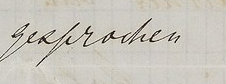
gesprochen
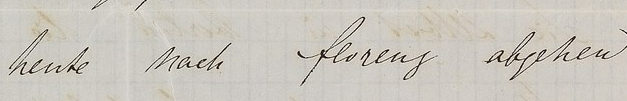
Februar nach Florenz abgehen
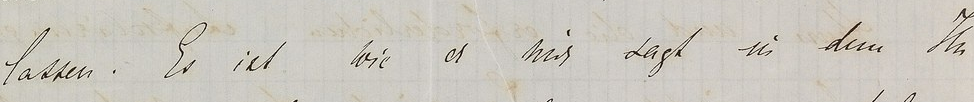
lassen. Es ist wie er mir sagt in dem Ih-
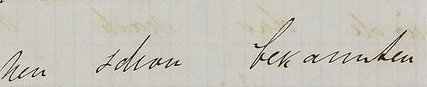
nen schon bekannten
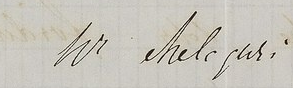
geht HrMelegari
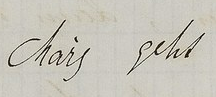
nach Italien
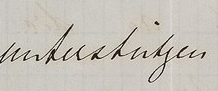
unterstützen.
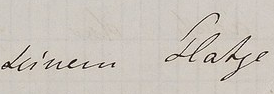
seinem Platze
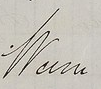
seine
